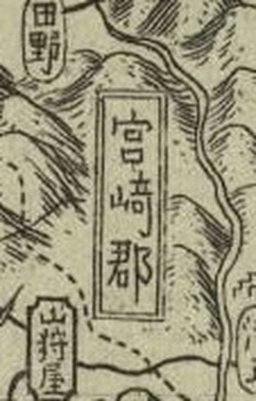宮崎郡
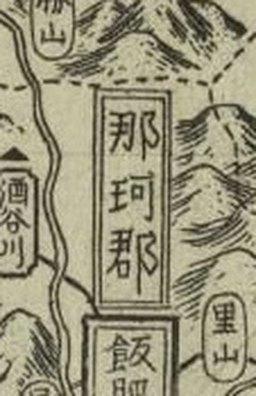那珂郡

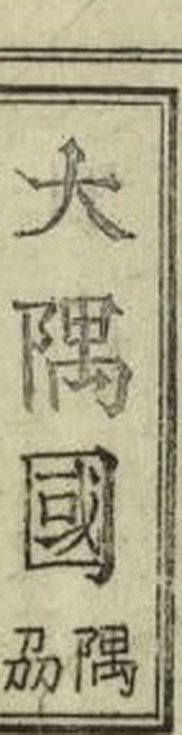大隅郡
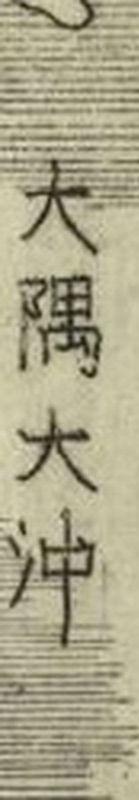大隅大沖
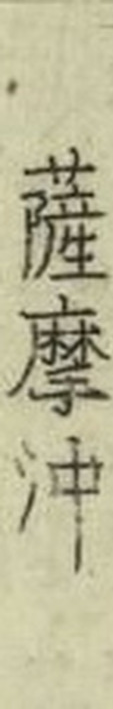薩摩沖
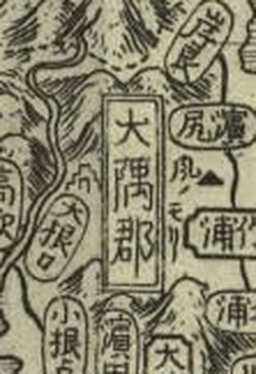大隅郡
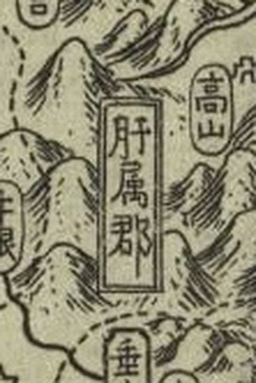肝属郡
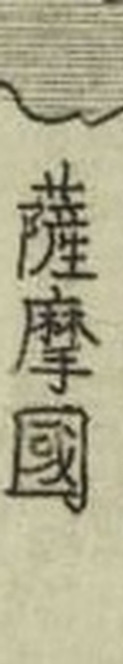薩摩沖

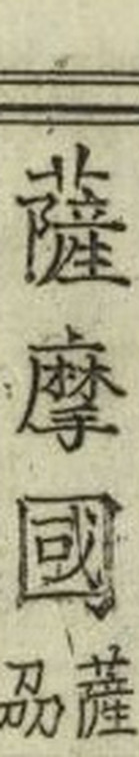薩摩郡
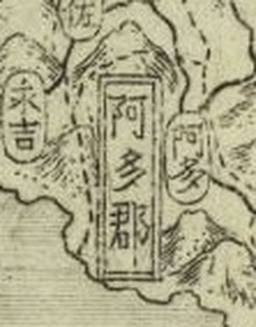阿多郡
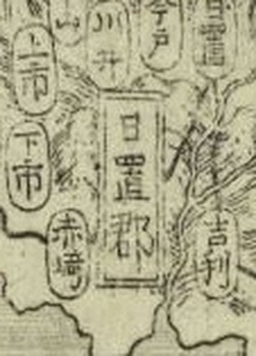日置郡
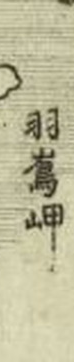羽嶌岬
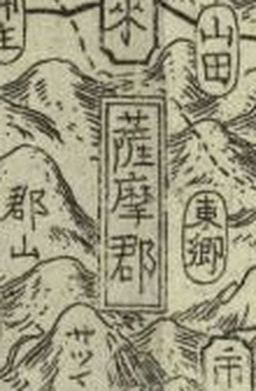薩摩郡
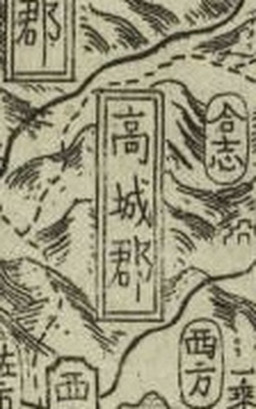高城郡
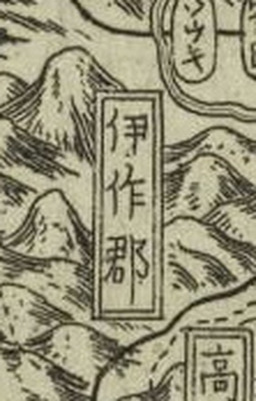伊作郡
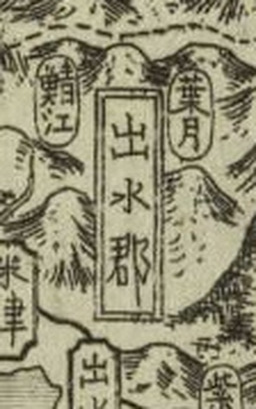出水郡
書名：大日本国細図 西国之部 下
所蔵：University of the Ryukyus Library
